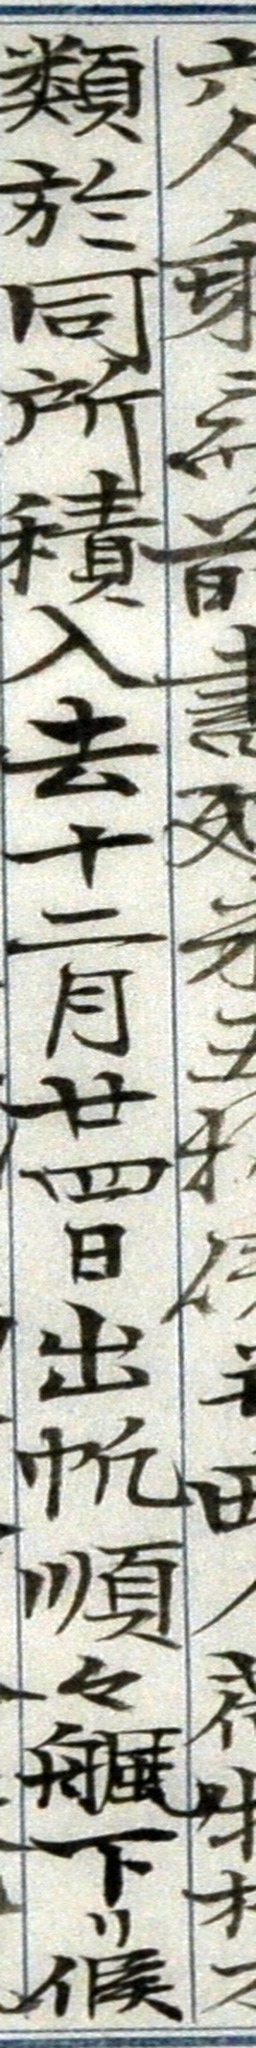類於同所積入去十二月廿四日出帆順々下り候
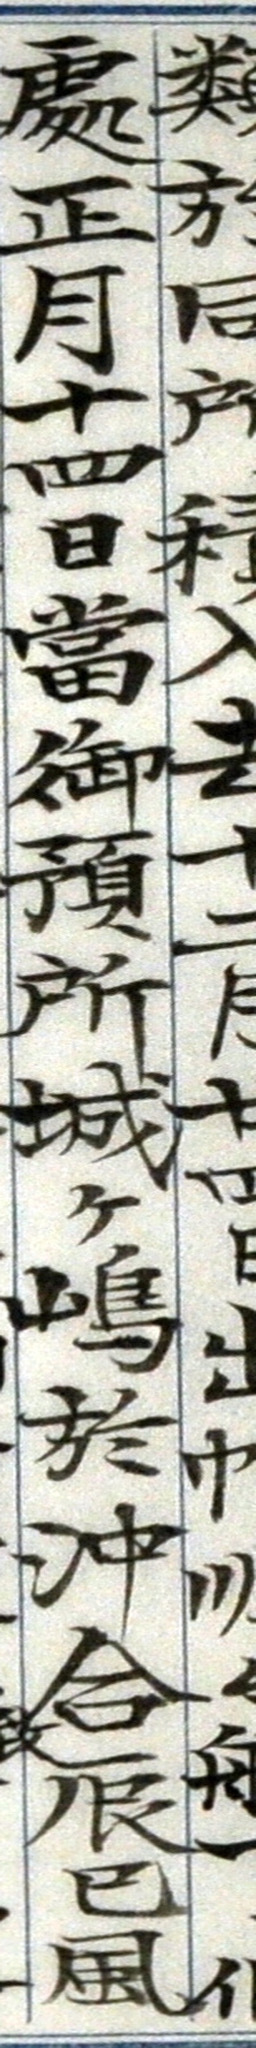處正月十四日当御預所城ヶ島於沖合辰巳風
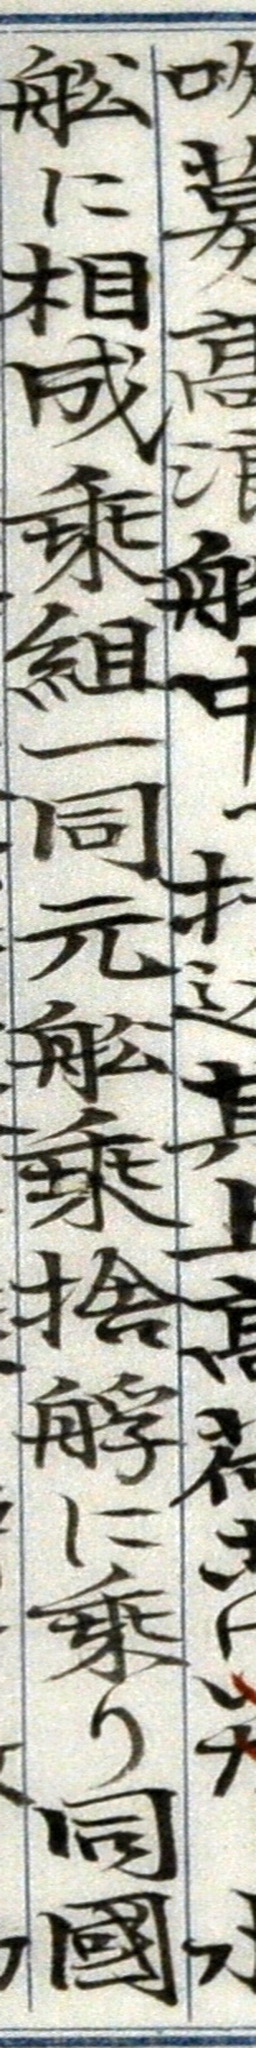船に相成乗組一同元船乗捨艀に乗り同国
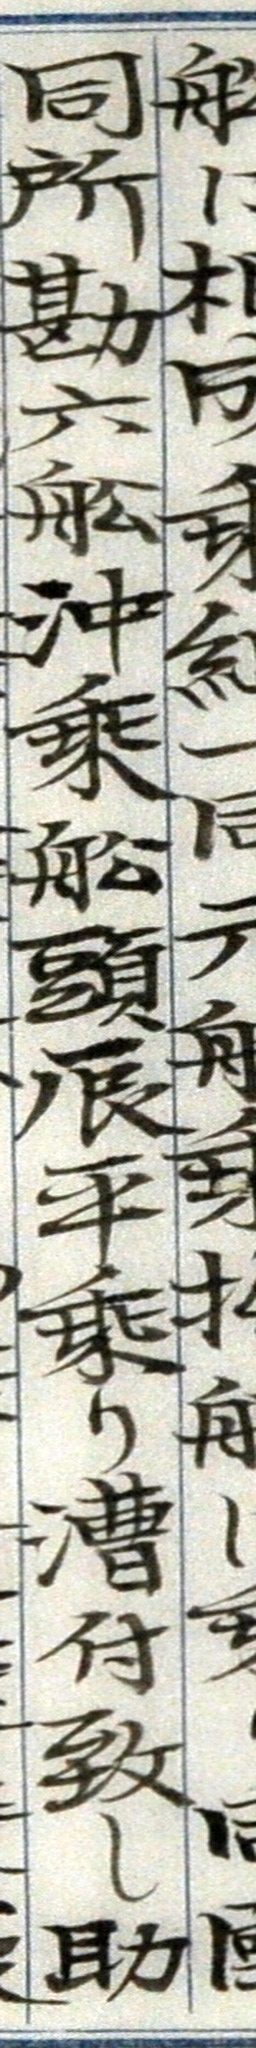同所勘六船沖乗船頭辰平乗り漕付致し助
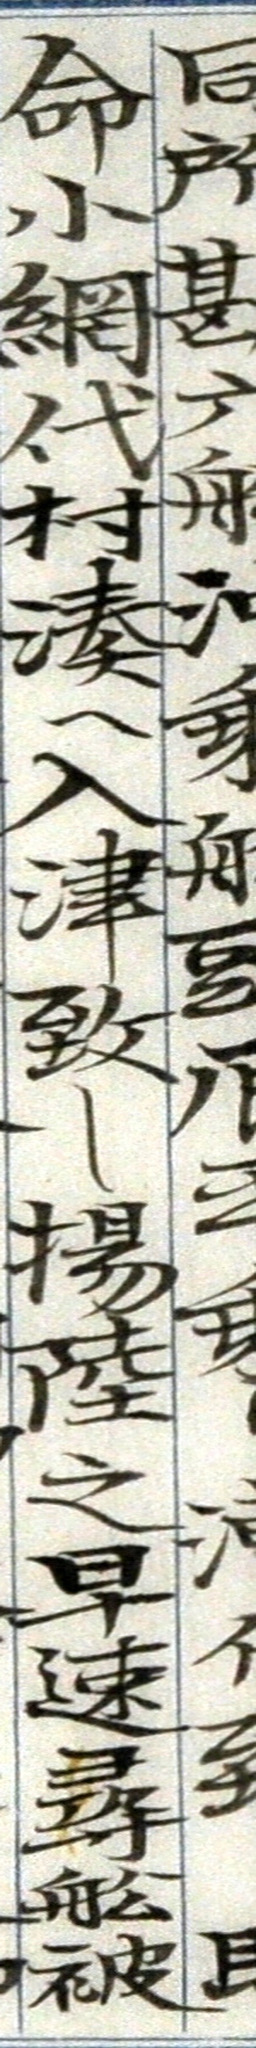命小網代村湊へ入津致し揚陸之早速尋船被
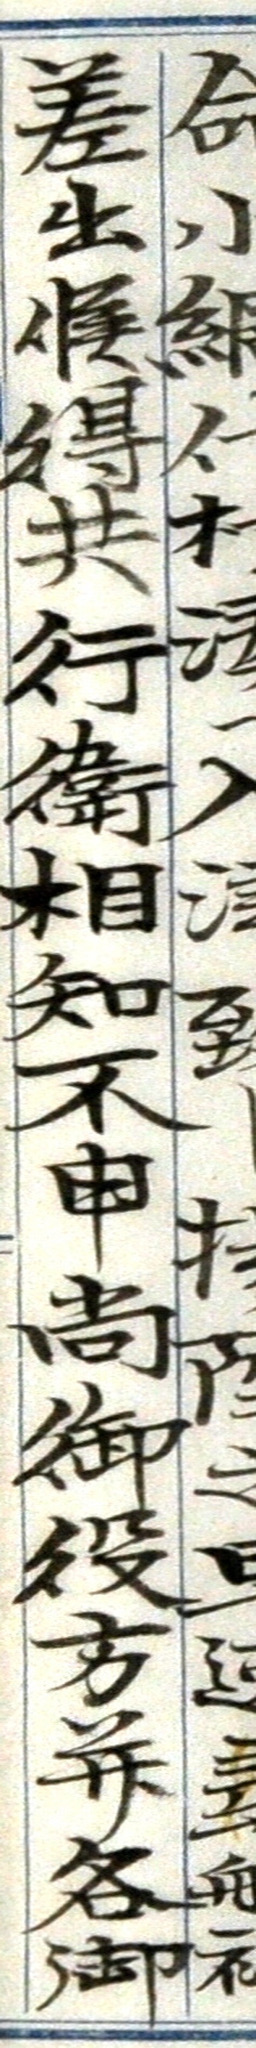差出候得共行え相知不申尚御役方并各御

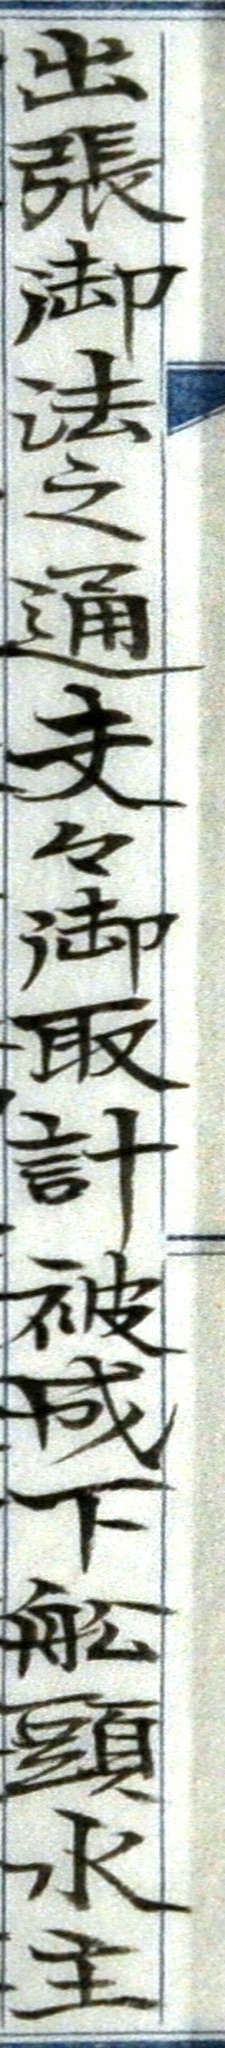出張御法之通夫々御取計被成下船頭水主
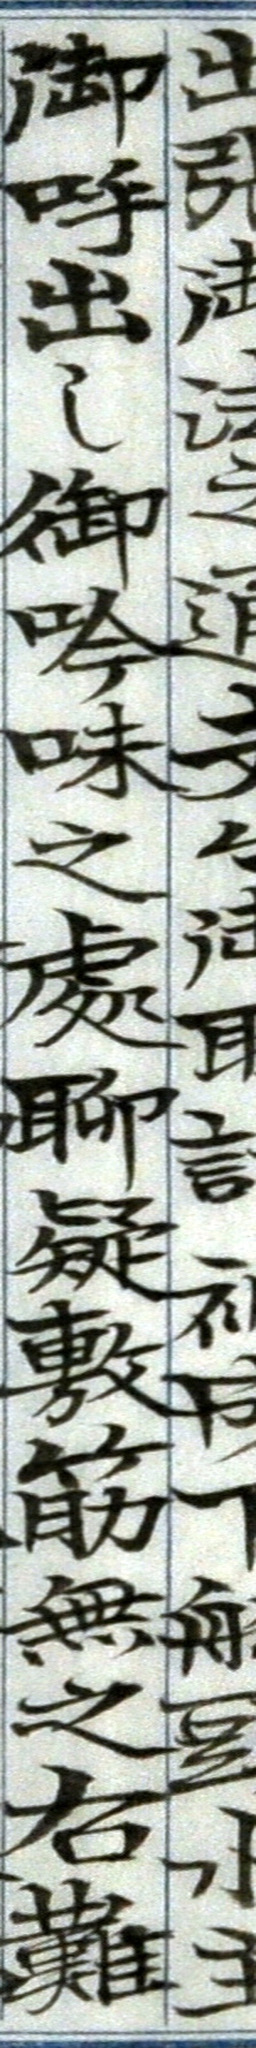御呼出し御吟味之處聊疑敷筋無之右難
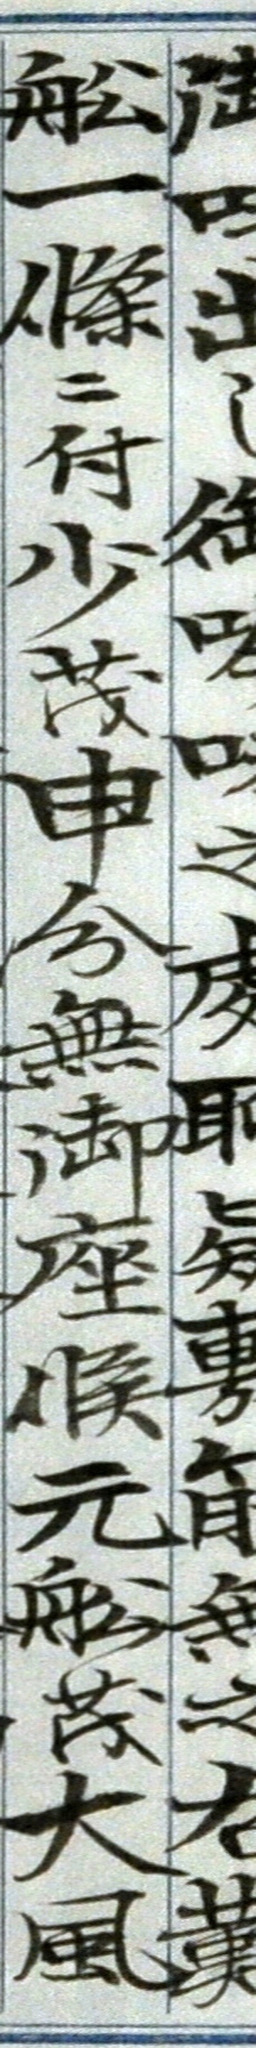船一條に付少も申分無御座候元船も大風
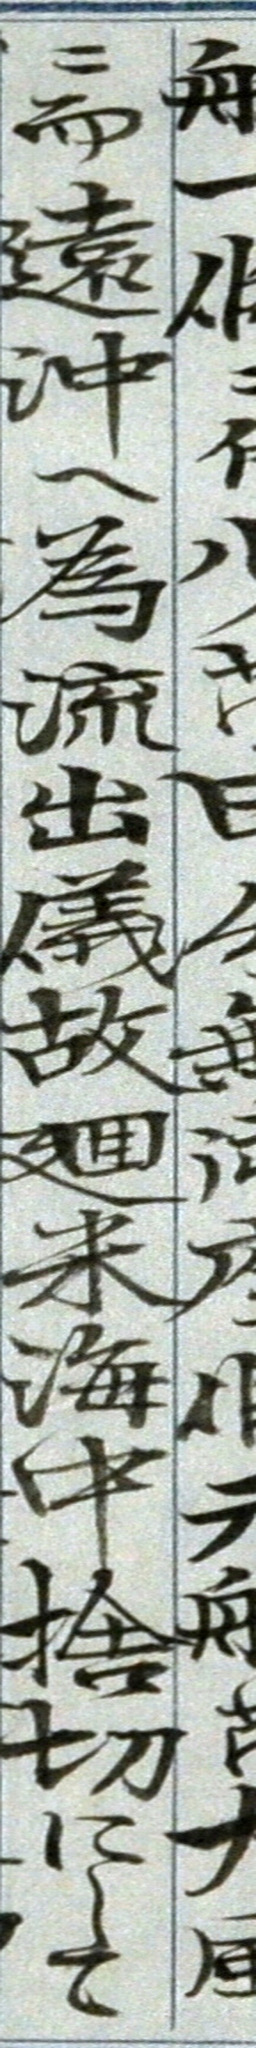に而遠沖へ為流出儀故廻米海中捨切にして
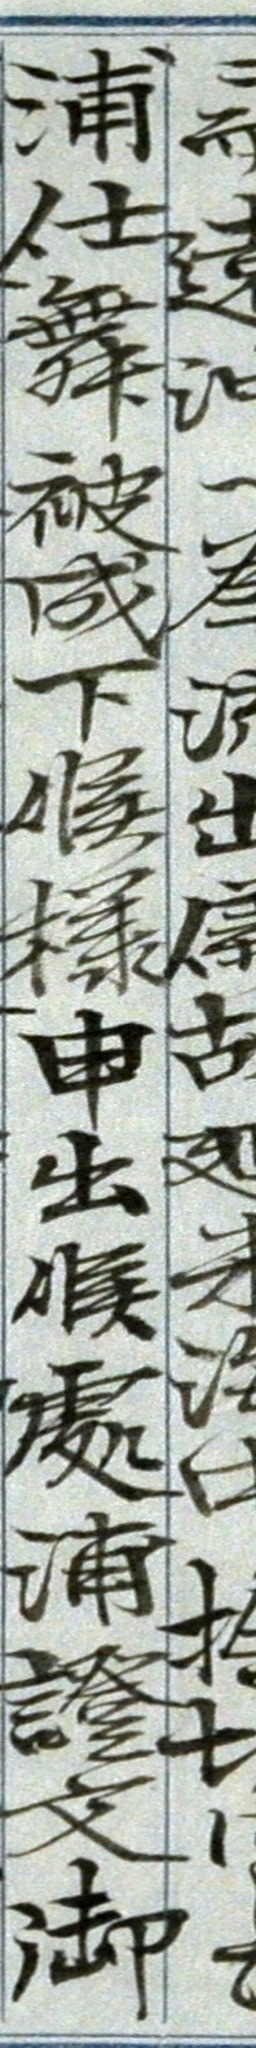浦仕舞被成下候様申出候處浦証文御
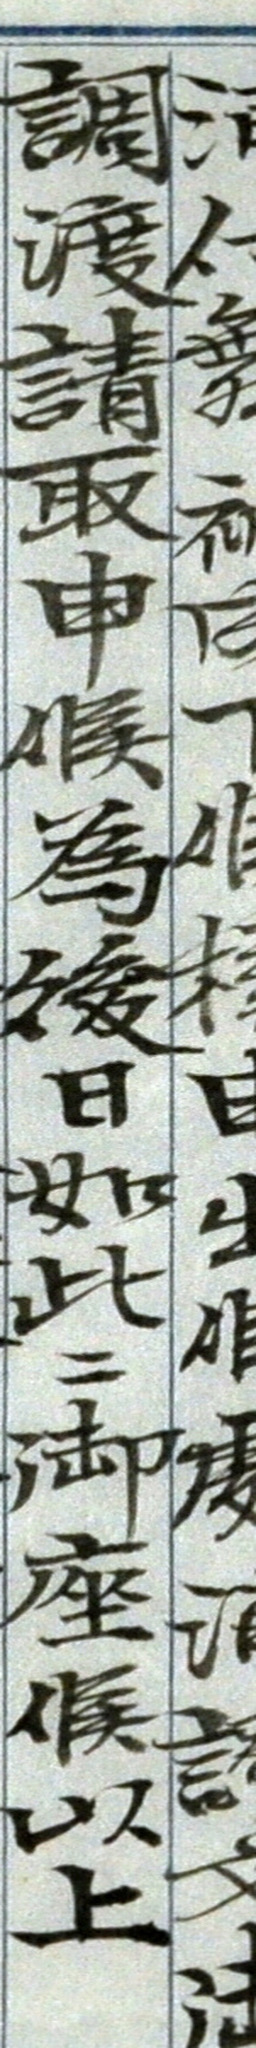調渡請取申候為後日如此に御座候以上
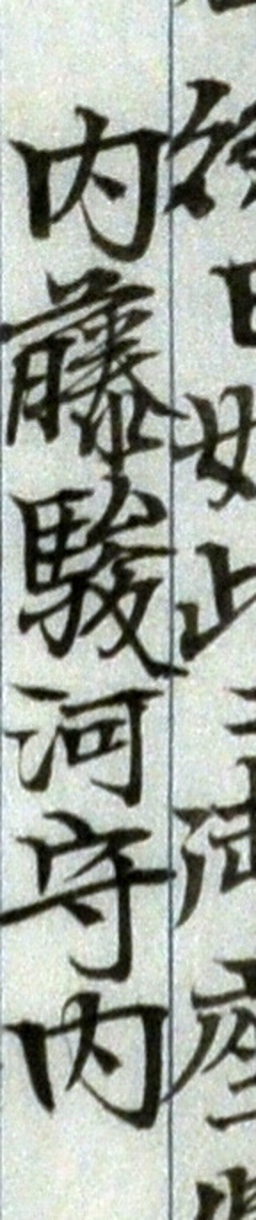内藤駿河守内
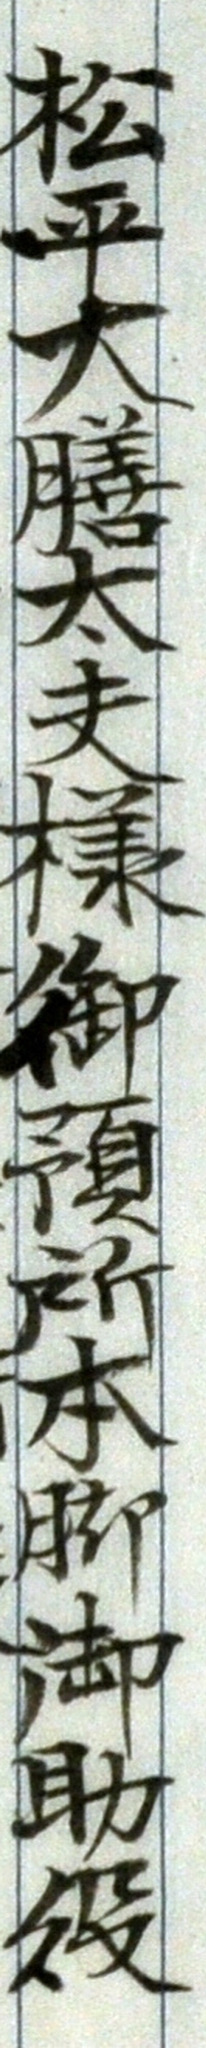松平大膳太夫様御預所本脚御助役
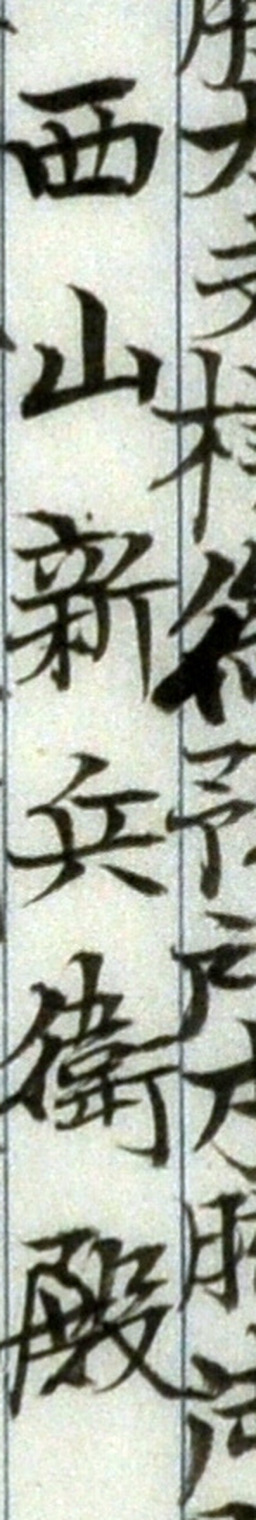西山新兵衛殿
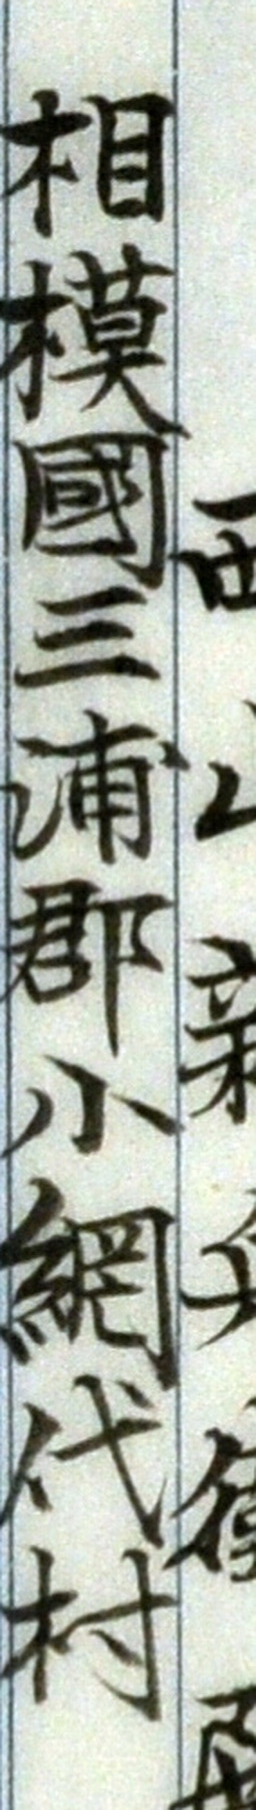相模国三浦郡小網代村
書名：御廻米難船始末
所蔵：伊那市立高遠町図書館・合同会社AMANE
